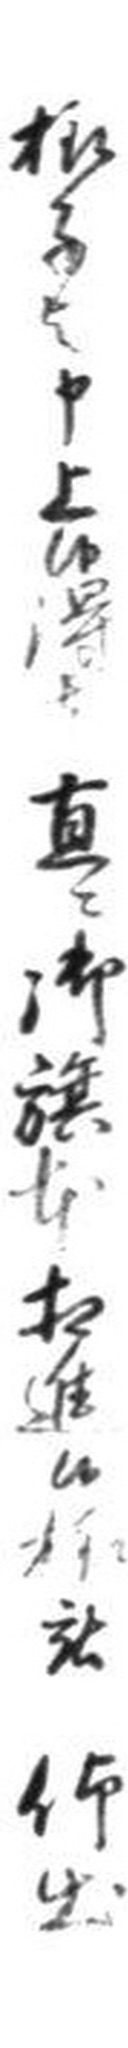様子与申上候得者直ニ御旗本相進候様被仰出
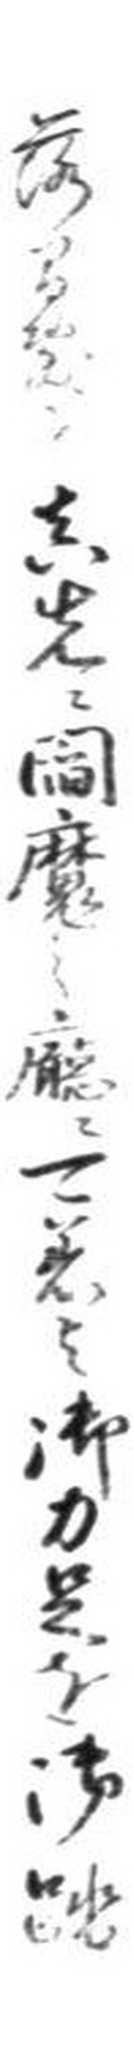落間真先ニ閻魔之庁ニ可着与御力足を御踏
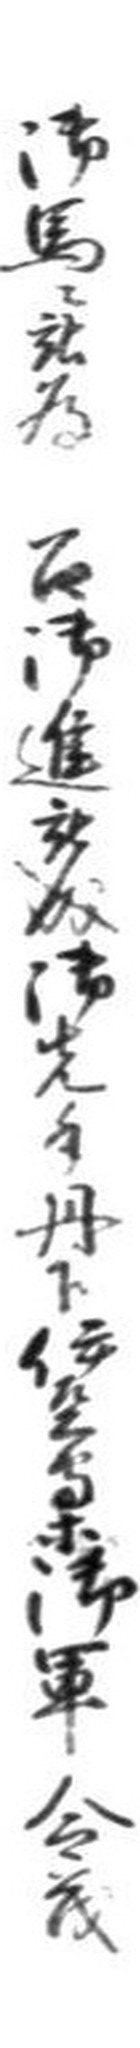御馬ニ被為召御進被成御先手丹下伊豆守等御軍令茂
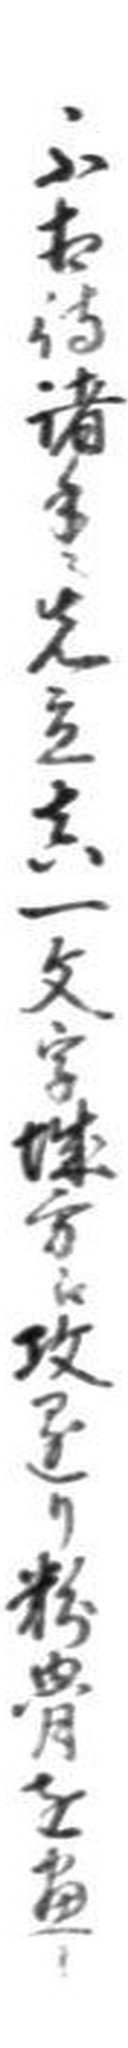不相待諸手ニ先立真一文字城方江攻懸り粉骨を尽し
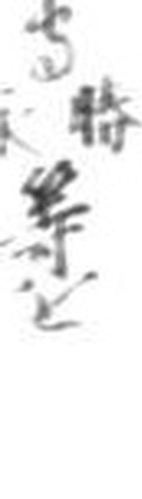永等を
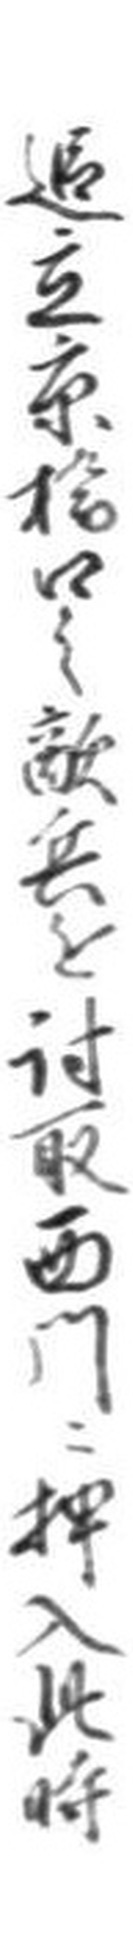追立京橋口之敵兵を討取西門ニ押入此時
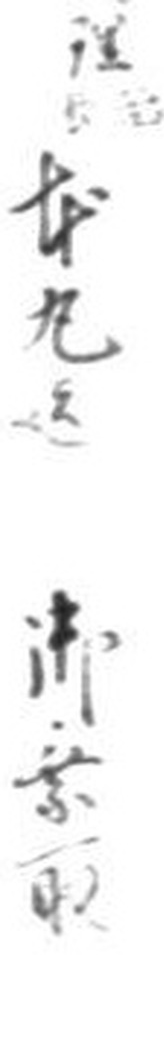宅本丸迄御乗取
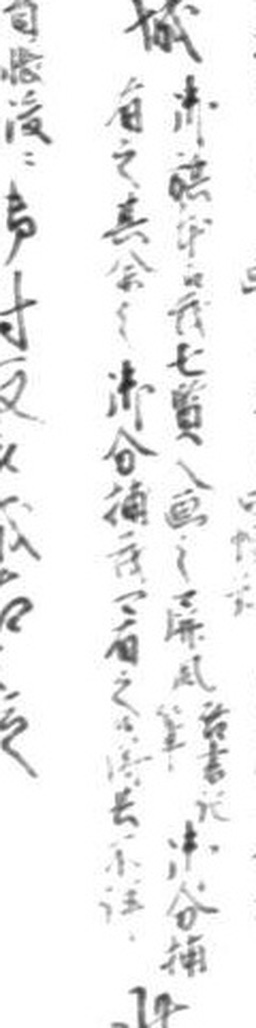有之其余之御分捕茂可有之候得共不詳此時
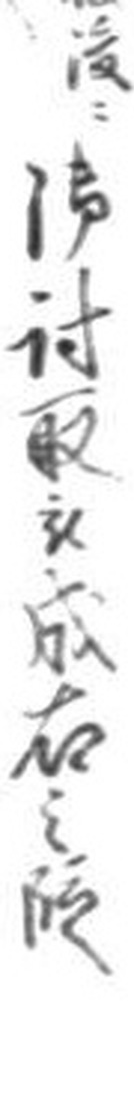記之御討取被成右之段
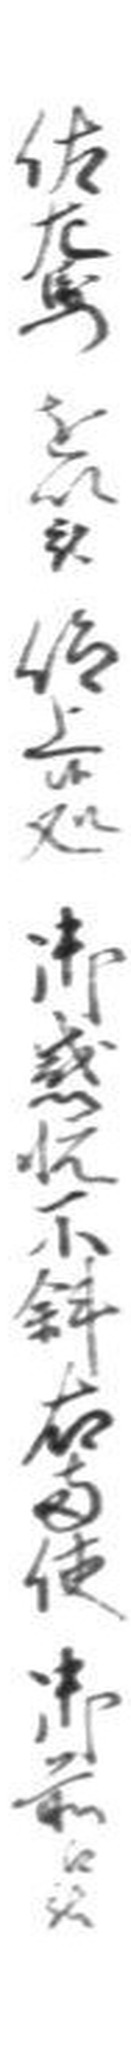佐左衛門を以被仰上候処御感悦不斜右両使御前江被

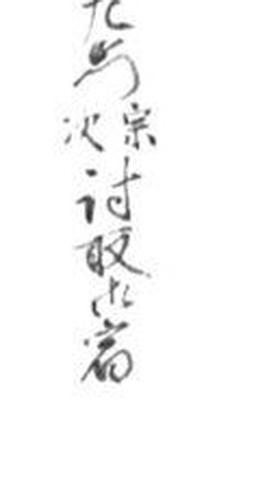次討取御宿
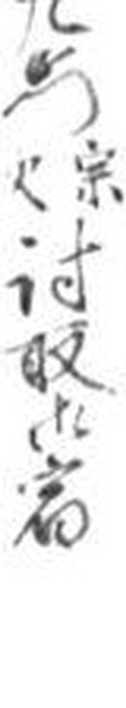次討取御宿
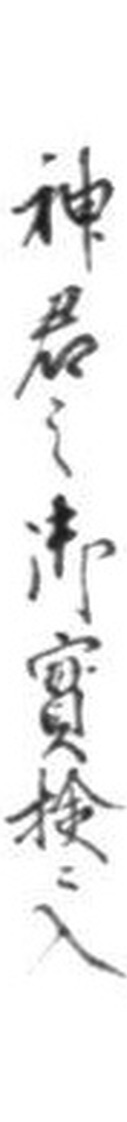神君之御実検ニ入
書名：家譜 二 忠直公 従文禄四年到慶安四年
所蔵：福井県文書館 Fukui Prefectural Archives
